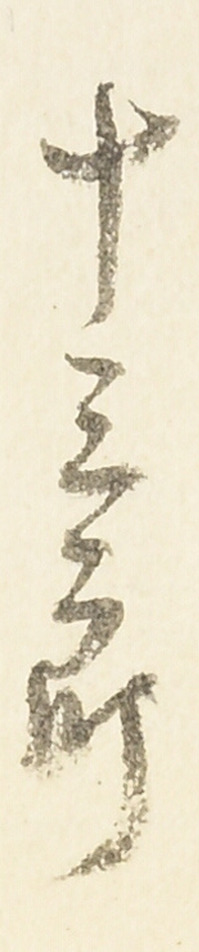十三郎
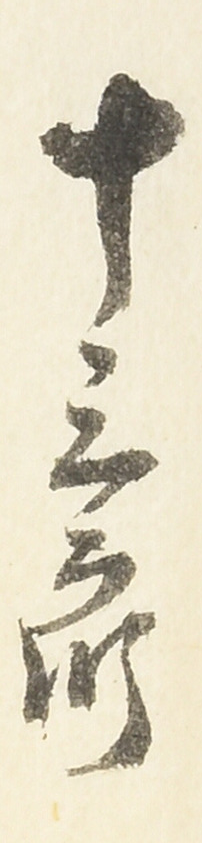十三郎
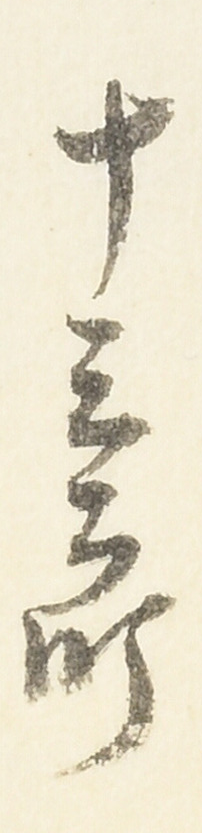十三郎
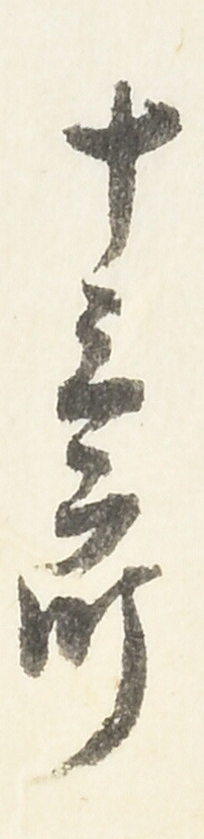十三郎

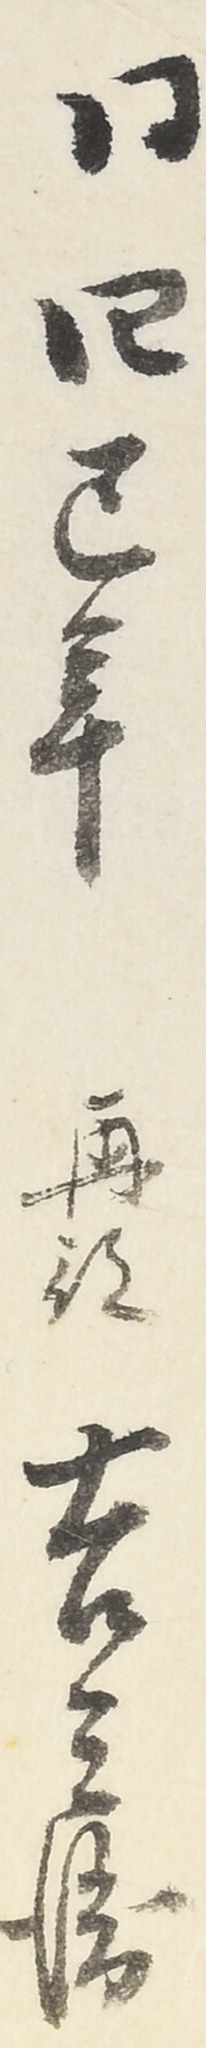同四巳年再役吉兵衛
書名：鉾持町丁代勤役年歴順控
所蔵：伊那市立高遠町図書館・合同会社AMANE
